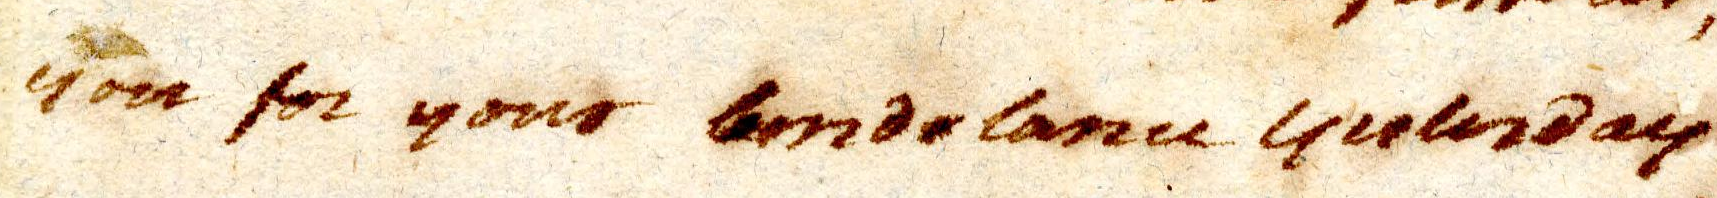you for your Condolance yesterday
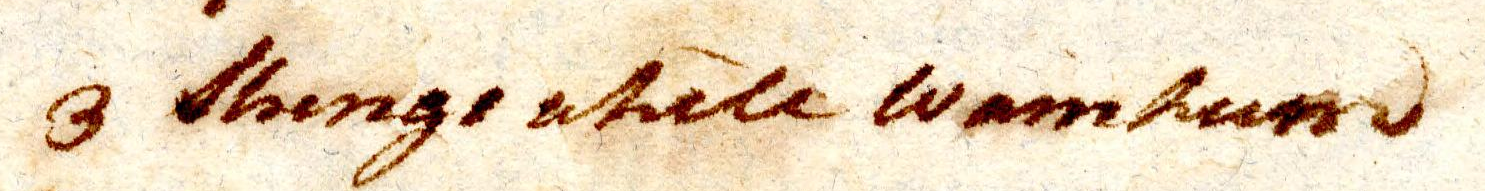3 Strings white wampum
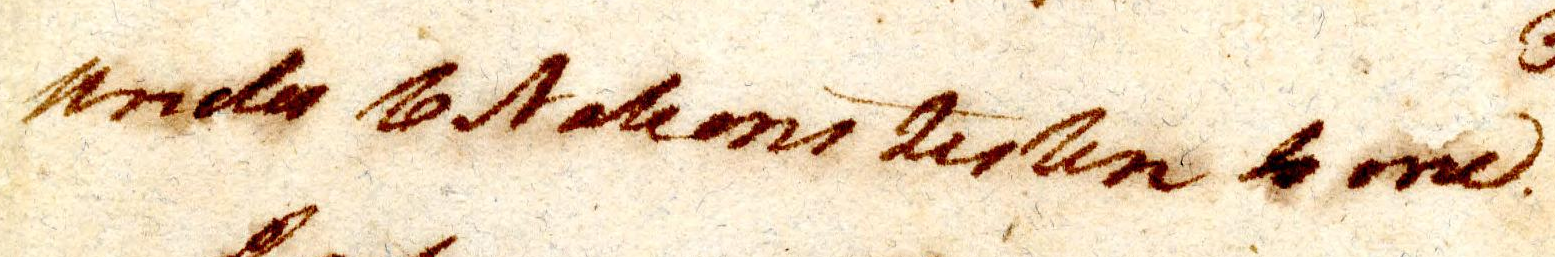Uncles 6 Nations Listen to me.
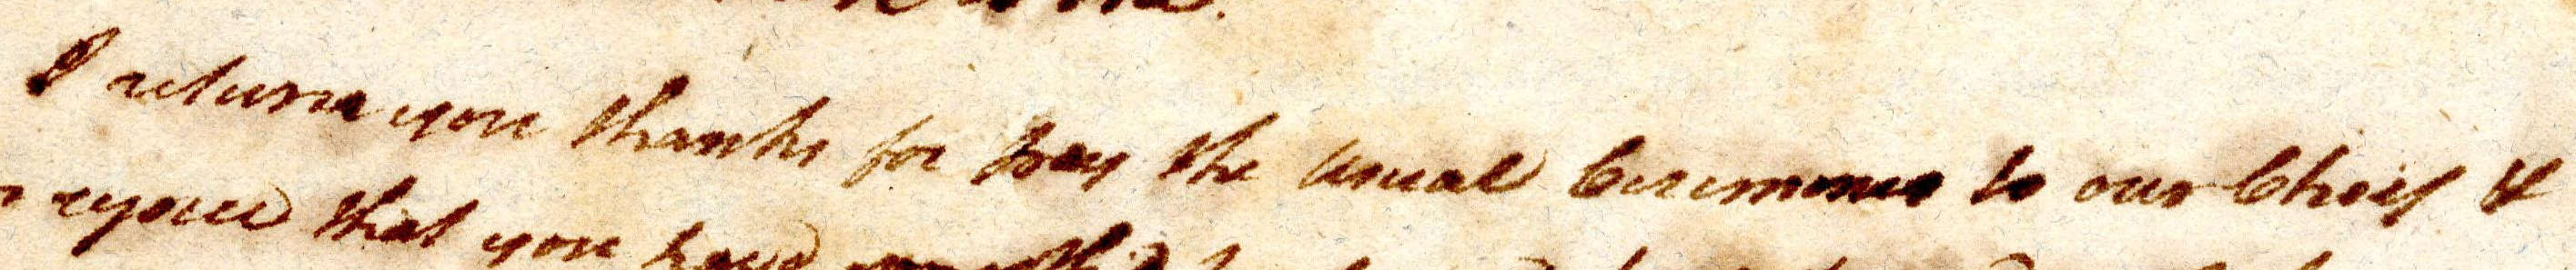I return you thanks for pay the usual Ceremones to our Chief &
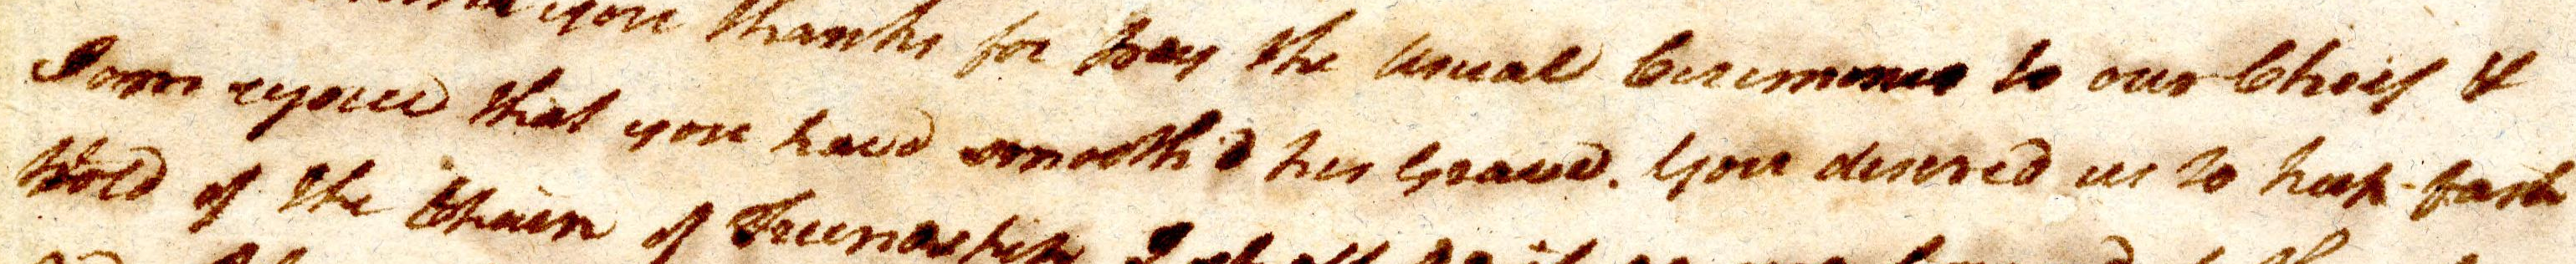I am rejoiced that you have smooth'd his Grave. You desired us to keep fast
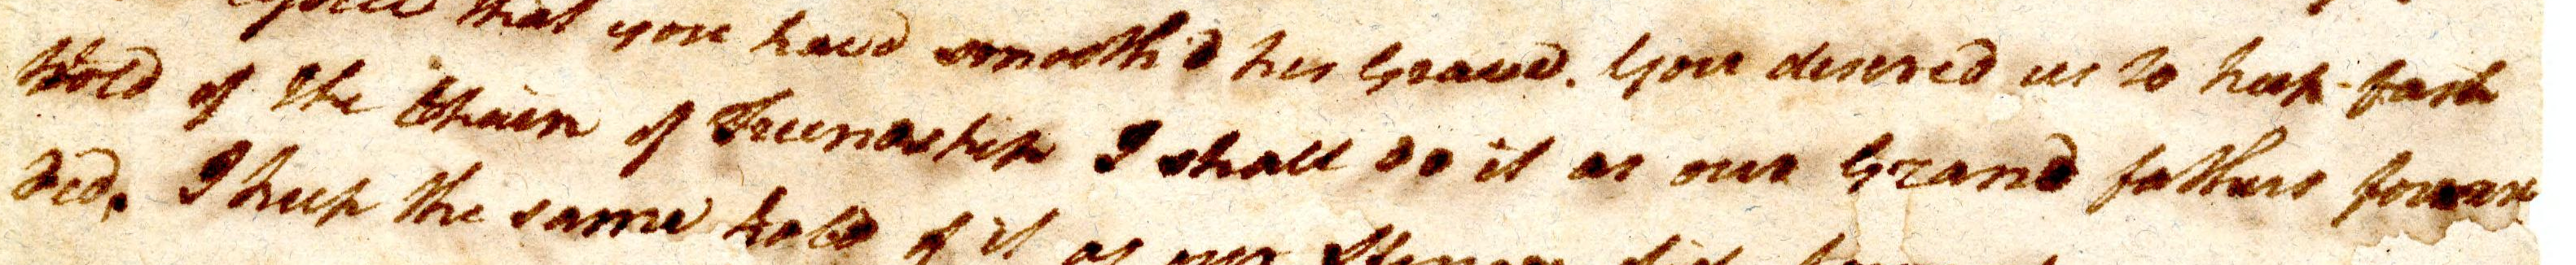Hold of the Chain of Friendship I shall do it as our Grand fathers foun-
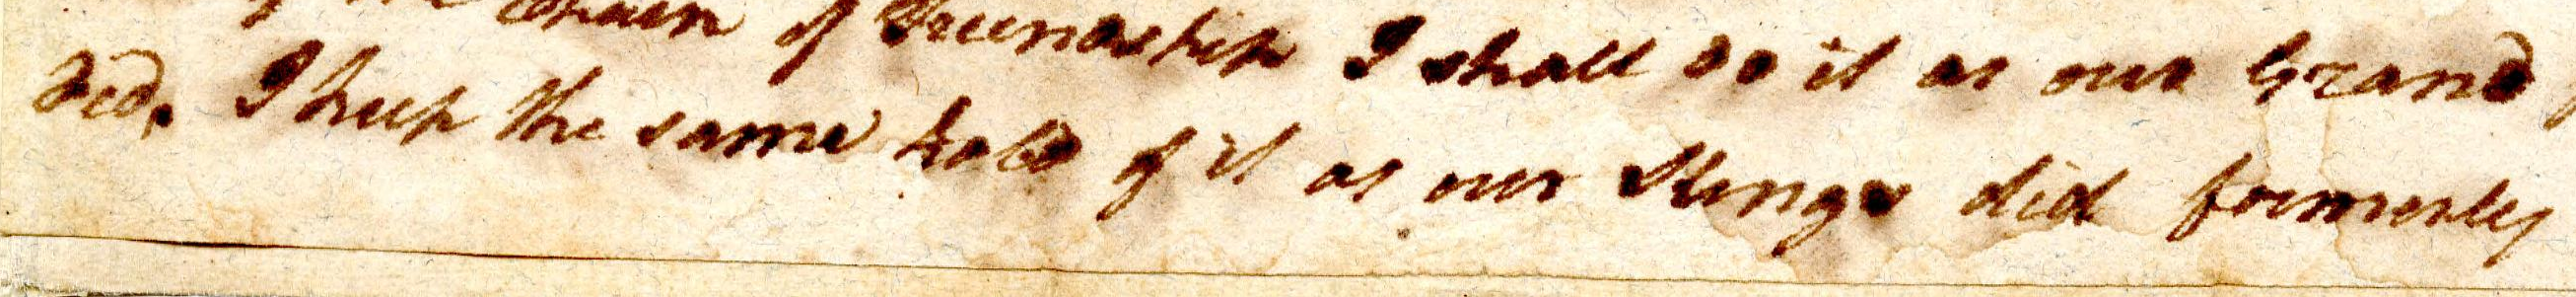ded. I keep the same hold of it as our Stinge did formerly-
